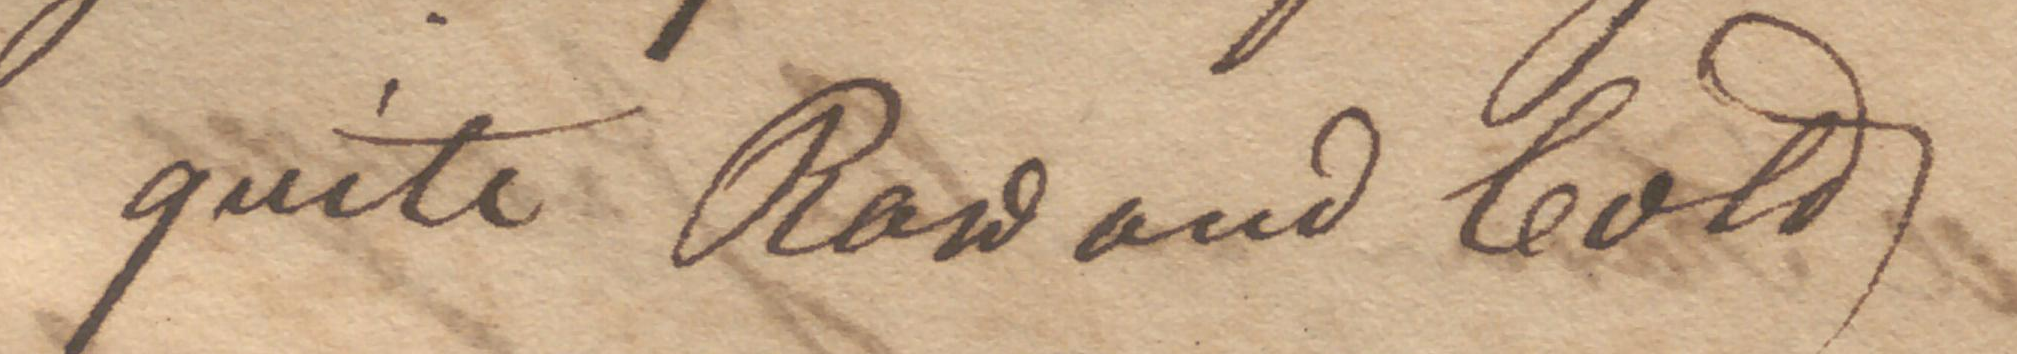quite Raw and Cold
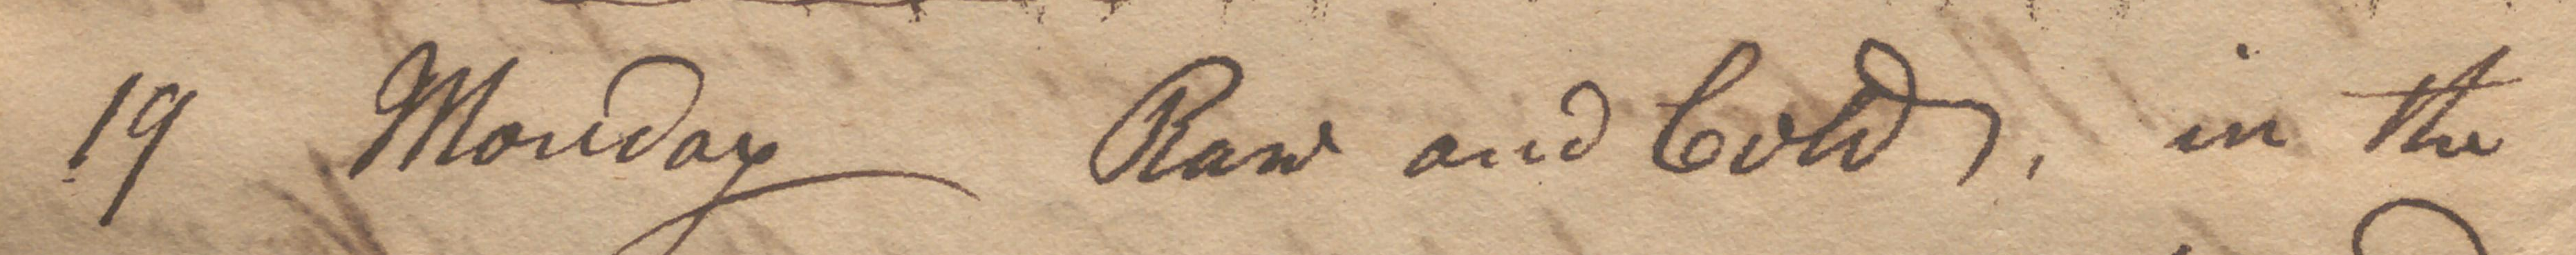19 Moreday- Raw and Cold. in the
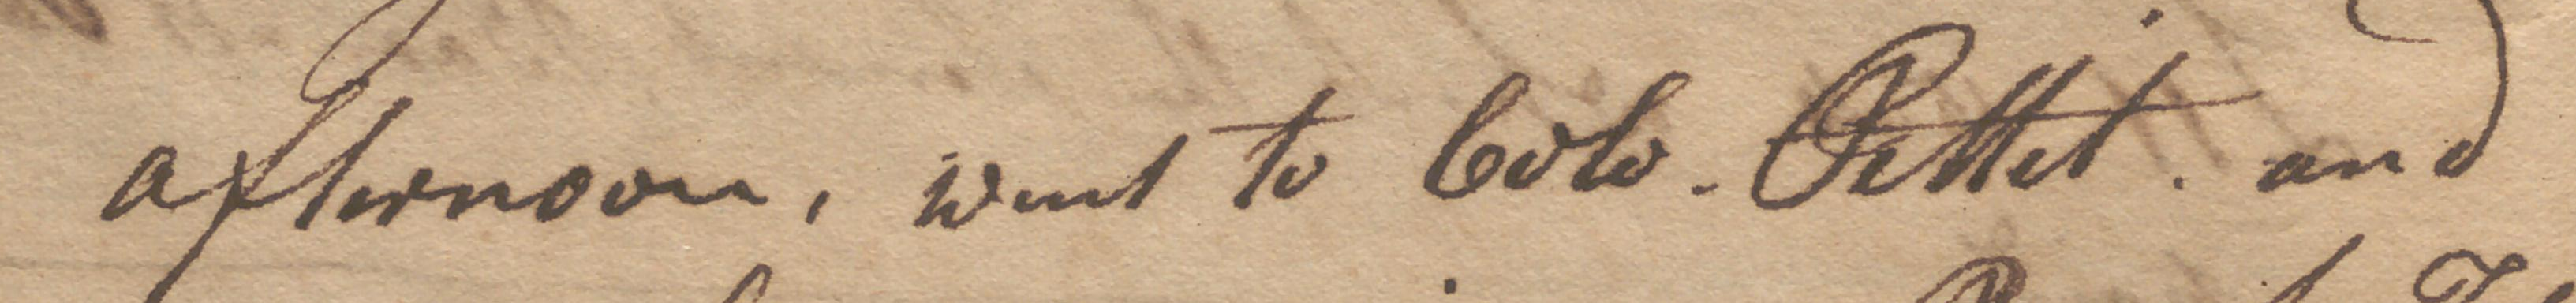afternoon, went to Cole. Pettit and
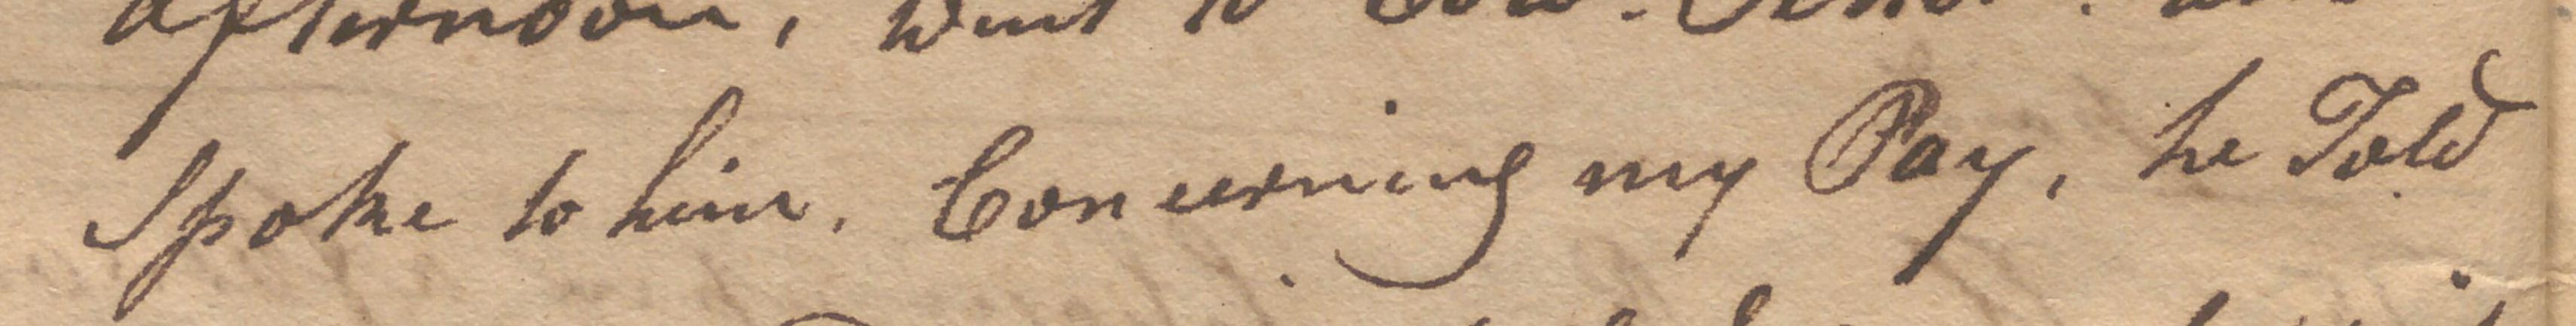spoke to him. Concerning my Pay, he Told
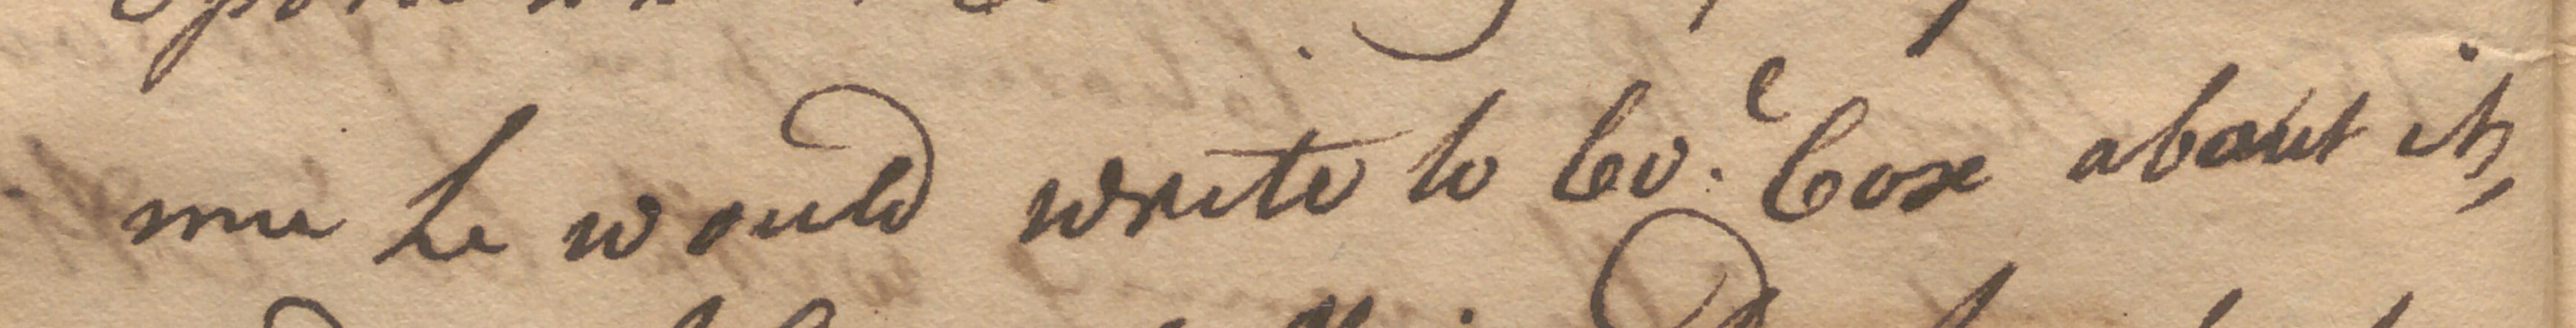me he would write to Co^l. Cox about it
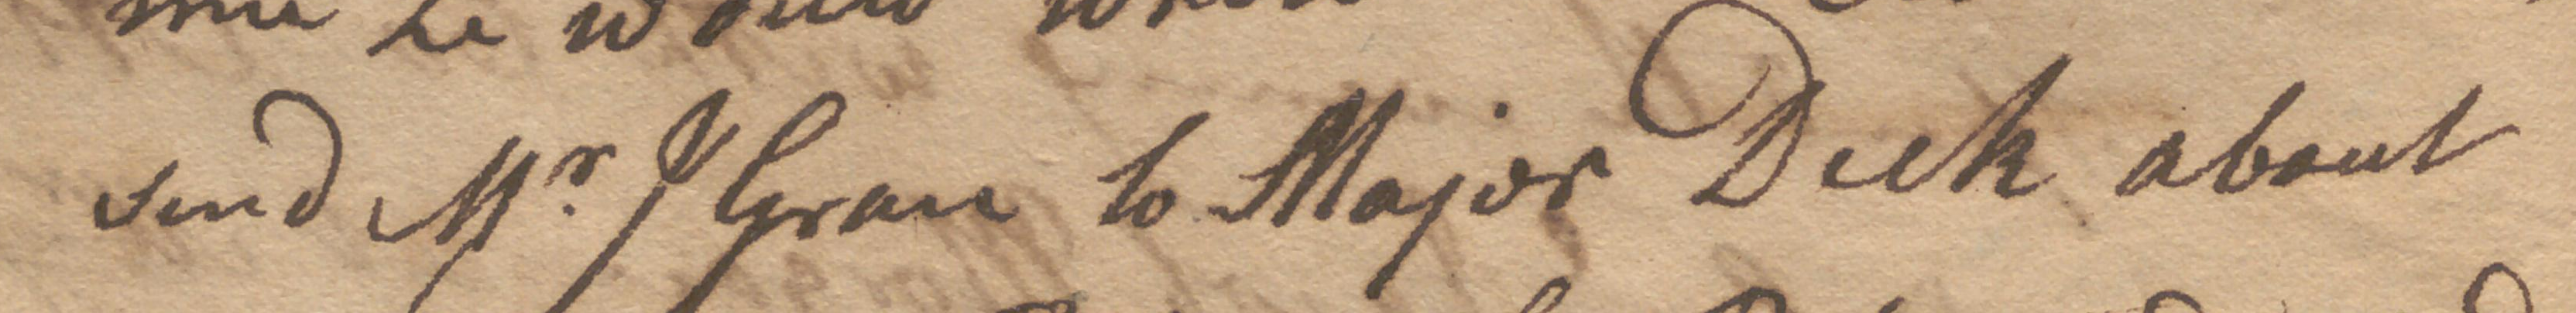send M^r. J Gram to Major Deck about
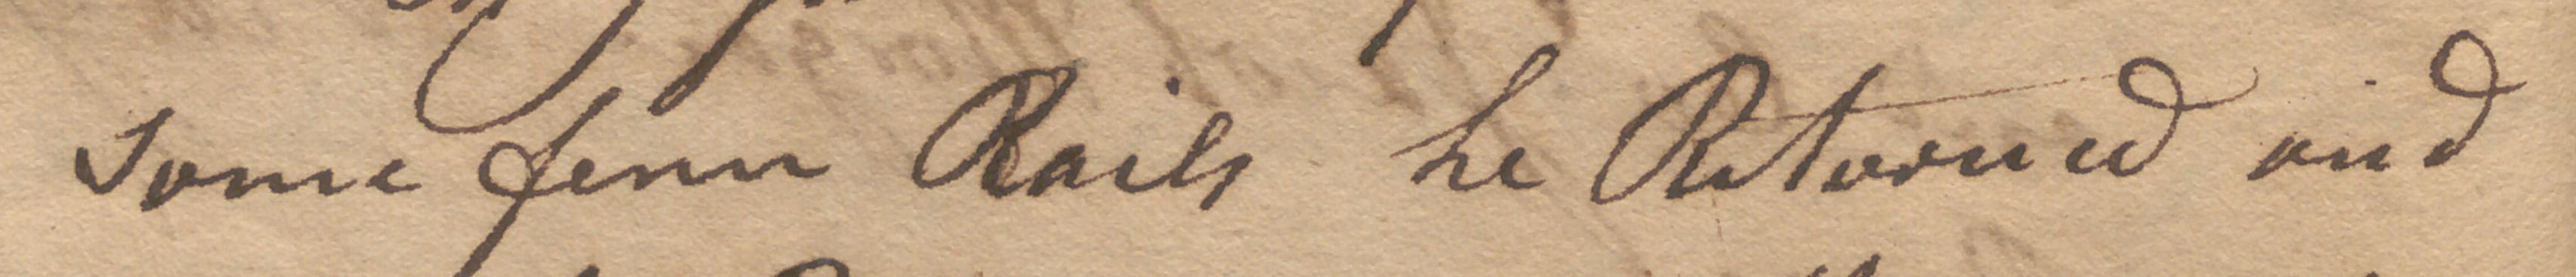some fenn Rails he Returned and
